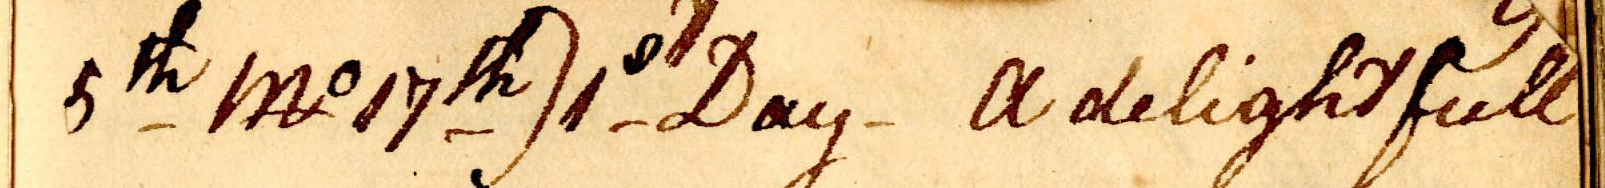5^th M^o 17^th) 1^st Day- A delightfull
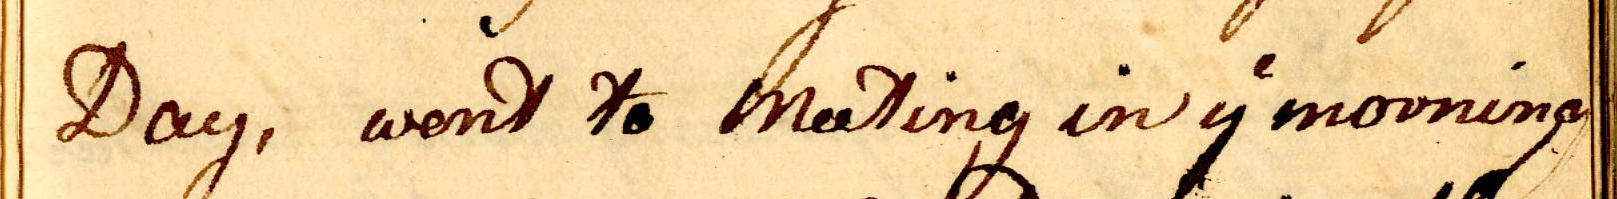Day, went to Meeting in y^e morning
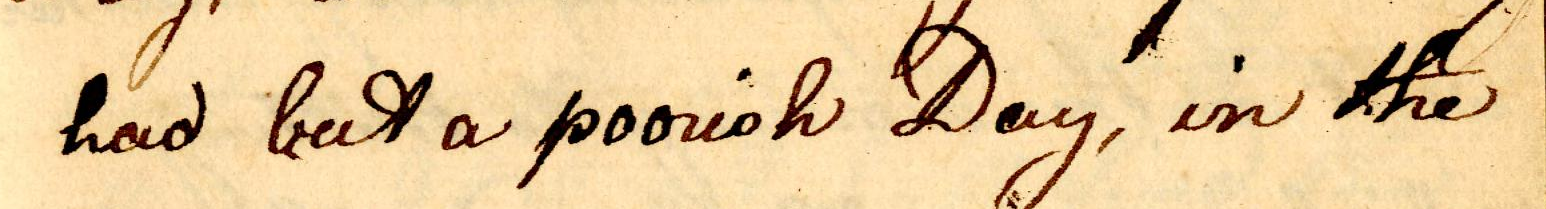had but a poorish Day, in the
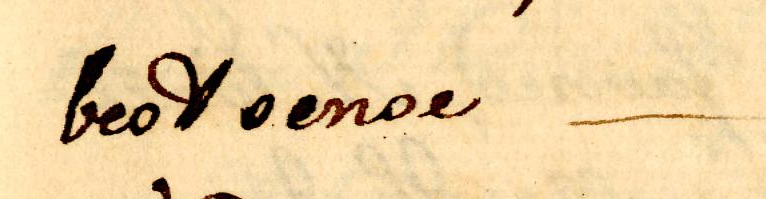best sense-
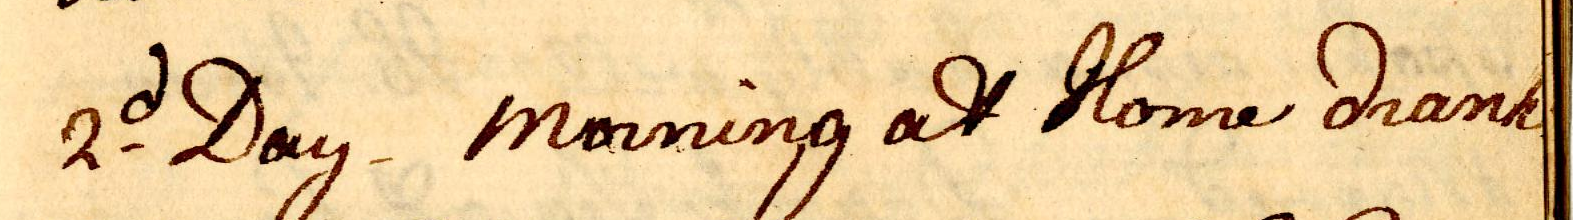2^d Day- Morning at Home drank
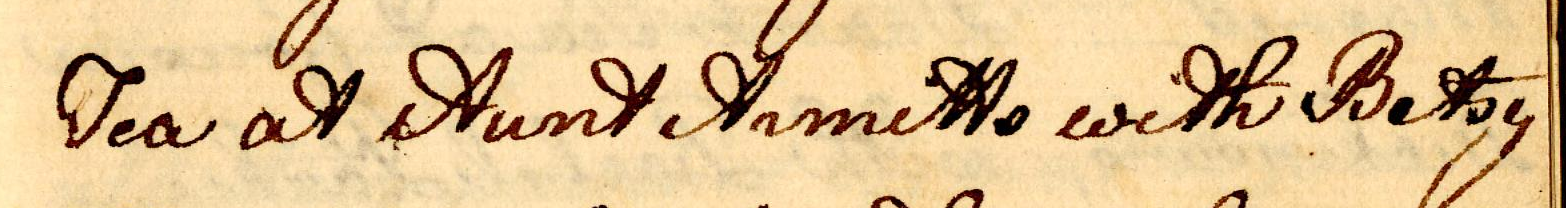Tea at Aunt Armitts with Betsy
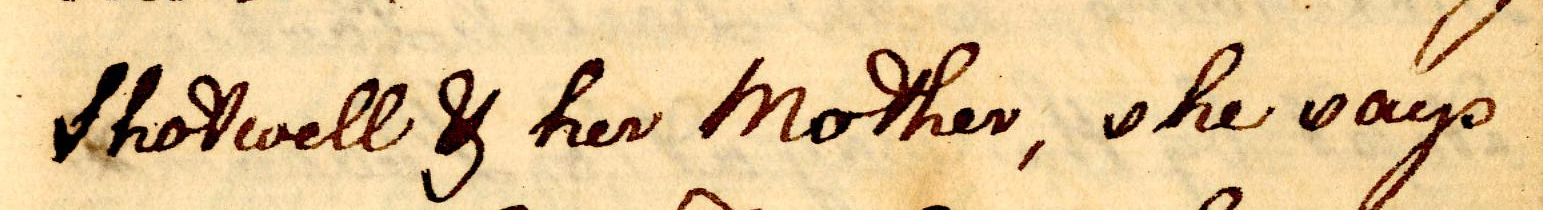Shotwell & her Mother, she says
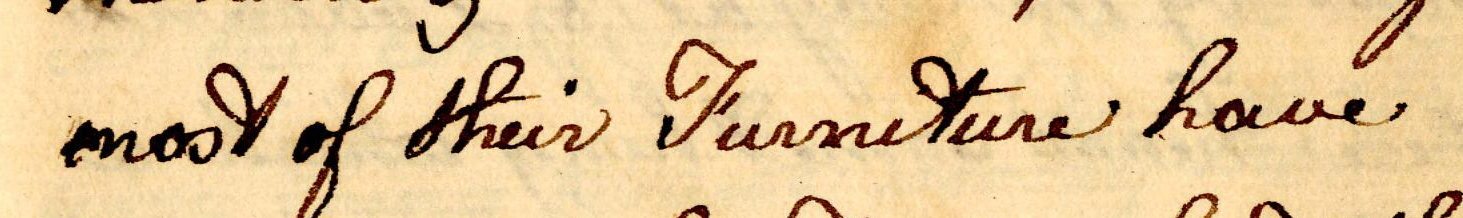most of their Furniture have
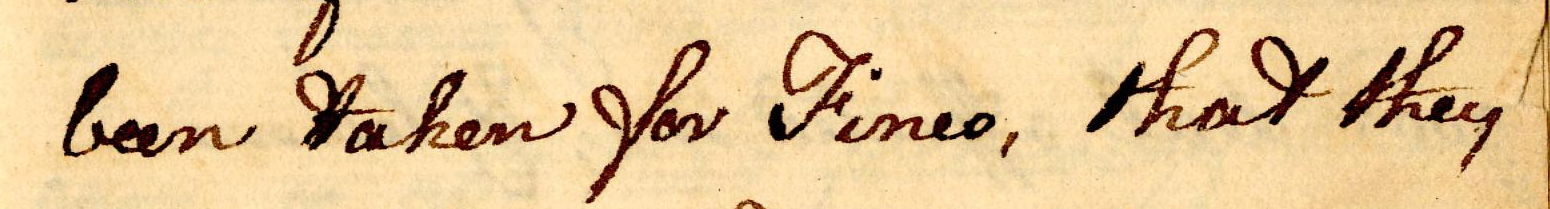been taken for Fines, that they
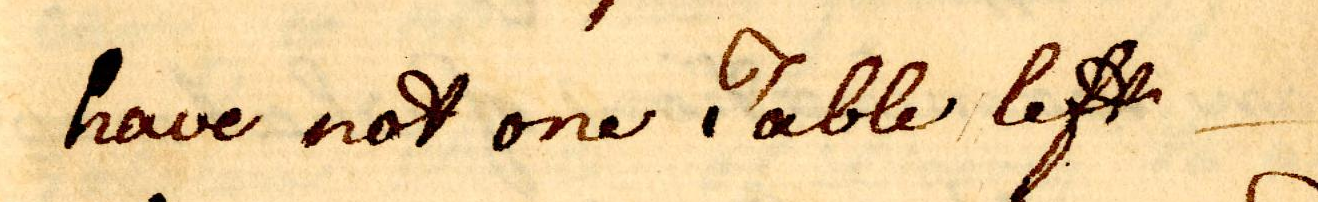have not one Table left
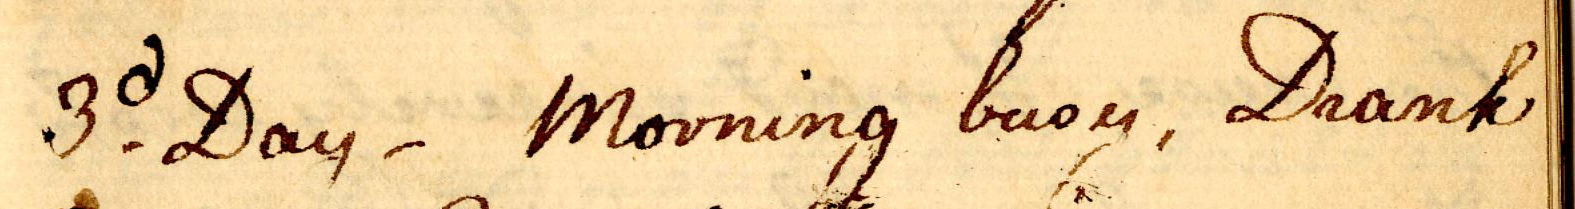3^d. Day- Morning busy, Drank
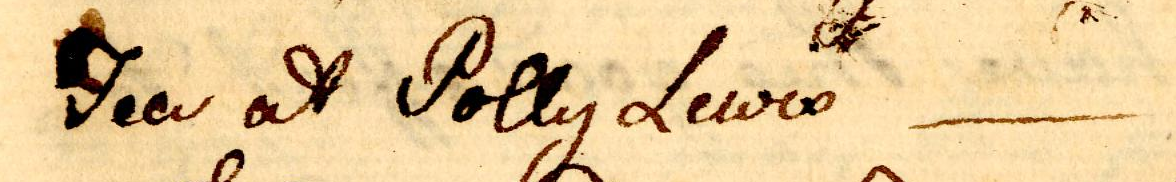Tea at Polly Lewis-
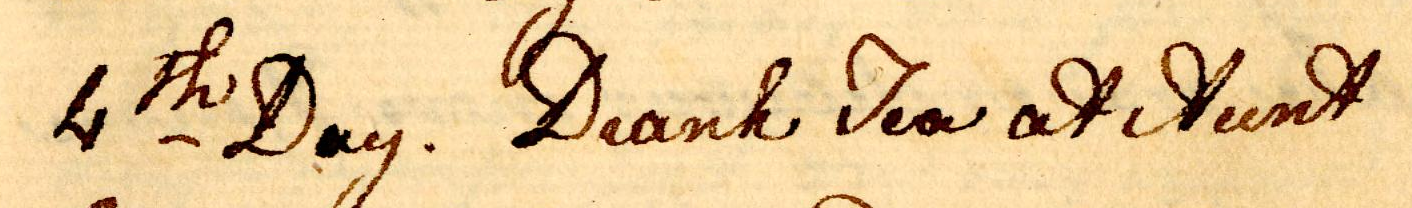4^th Day. Drank Tea at Aunt
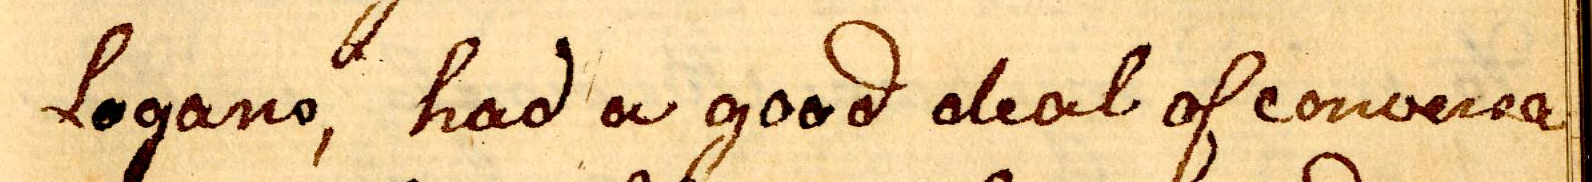Logans, had a good deal of conversa
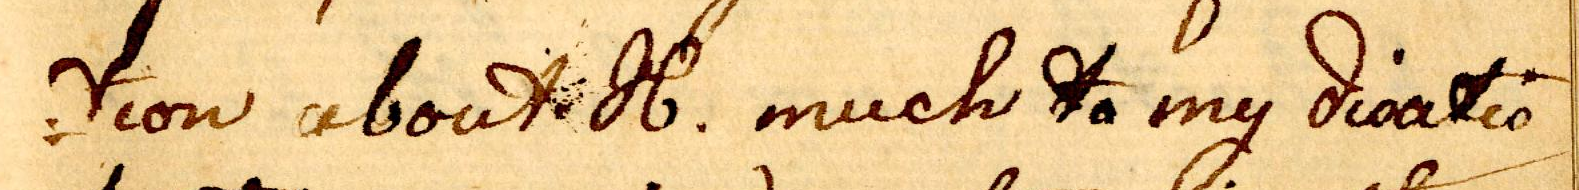-tion about H. much to my disatis
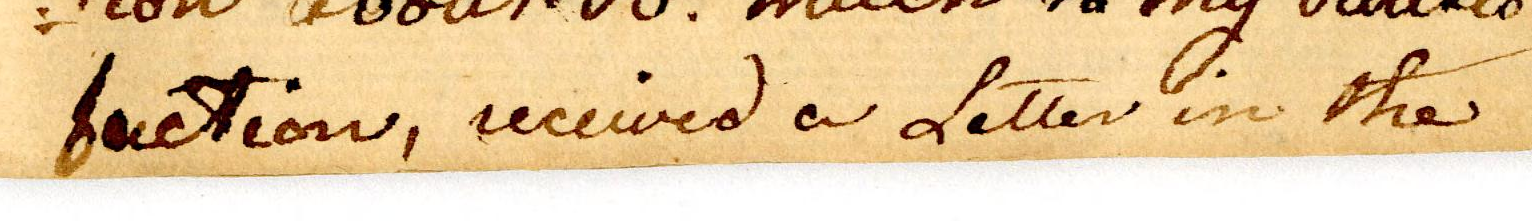faction, received a Letter in the
